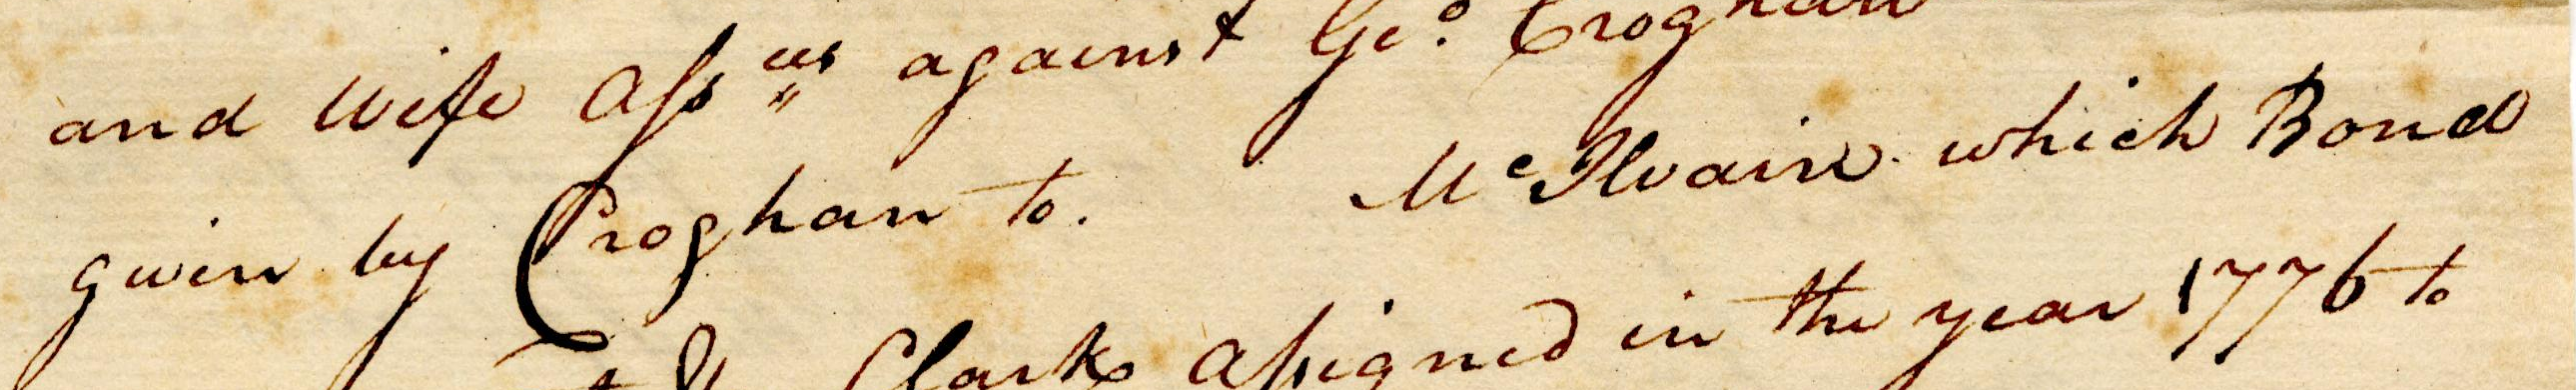given by Croghan to.- M^Ilvaine which Bond
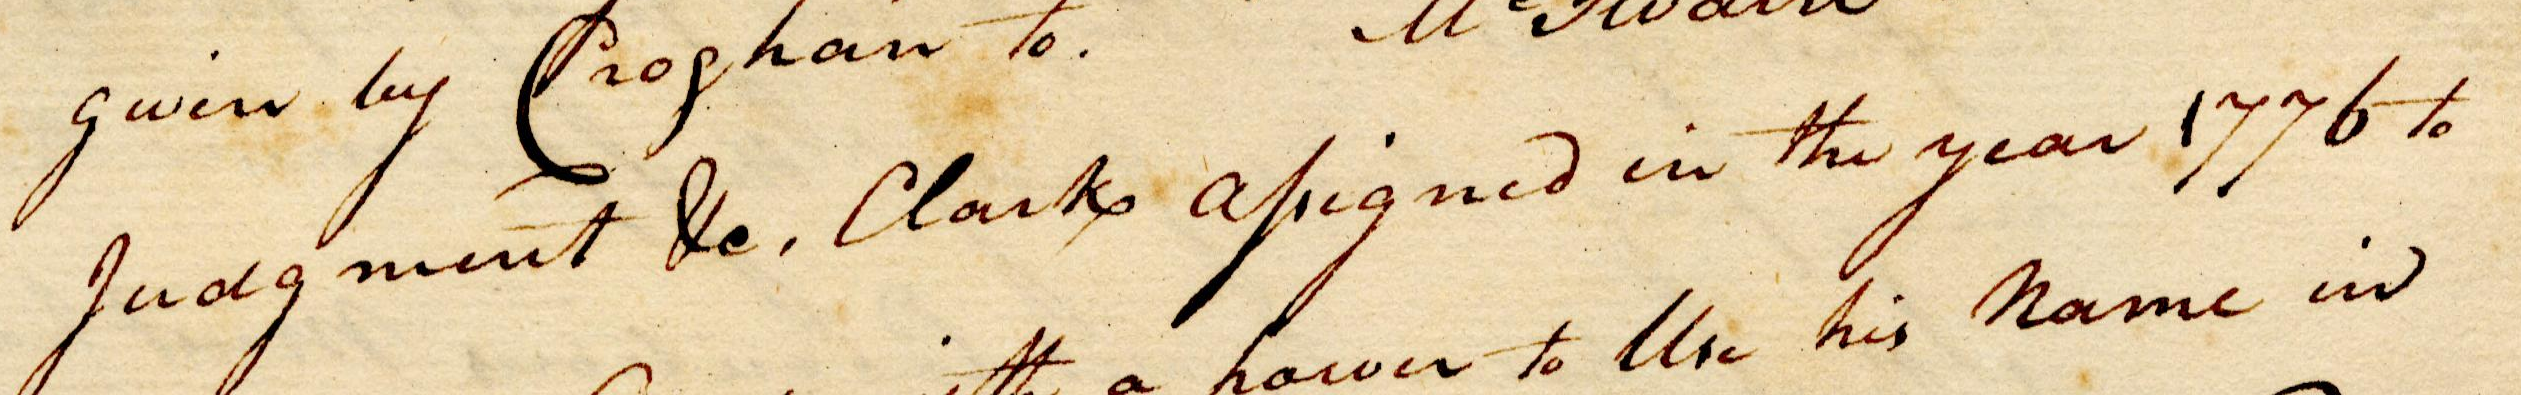judgement &c. Clark assigned in the year 1776 to
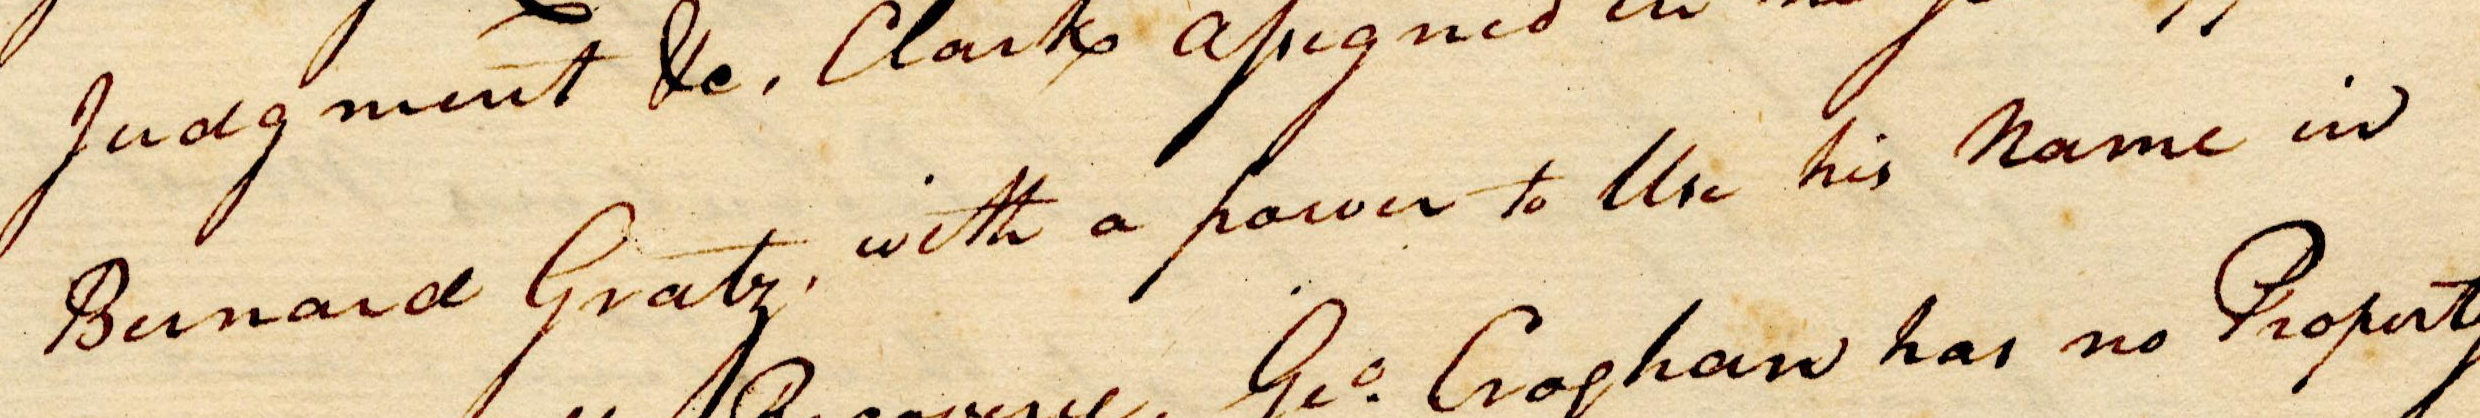Bernard Gratz, with a power to use his name in
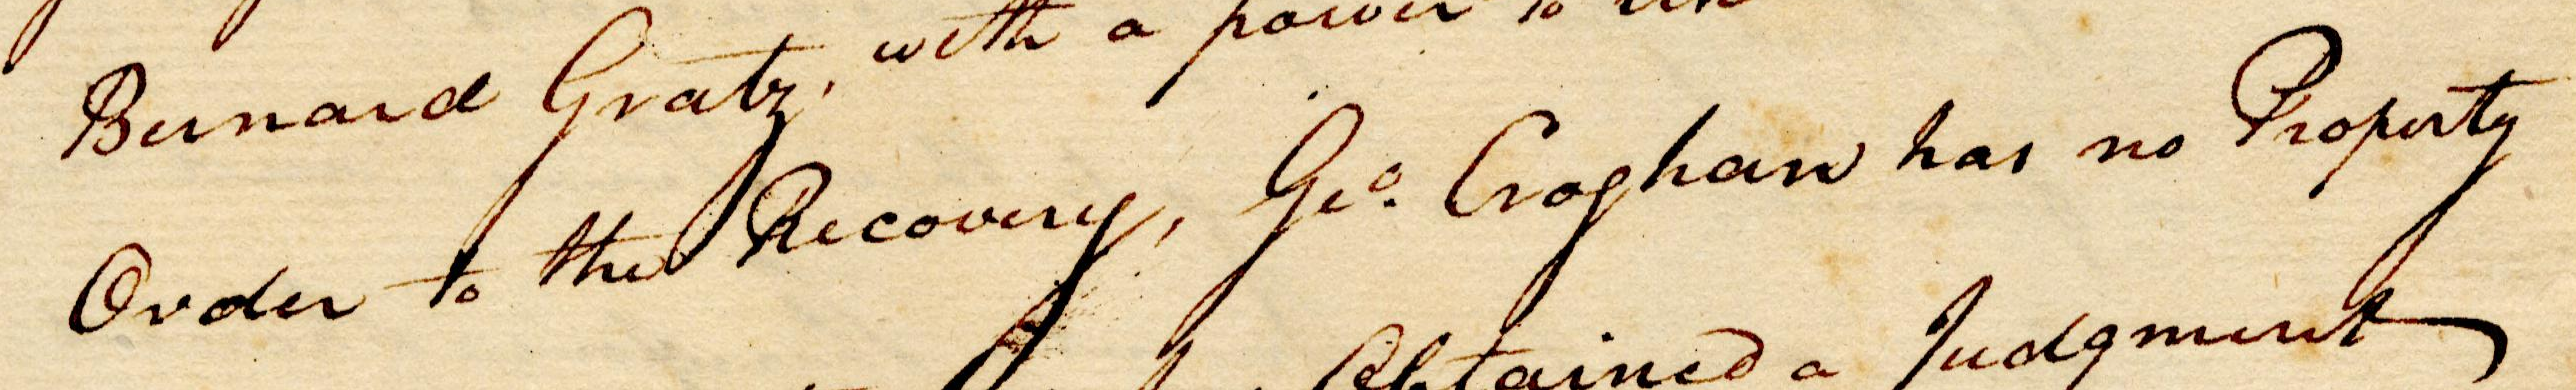Order to the Recovery, Ge^o. Croghan has no Property
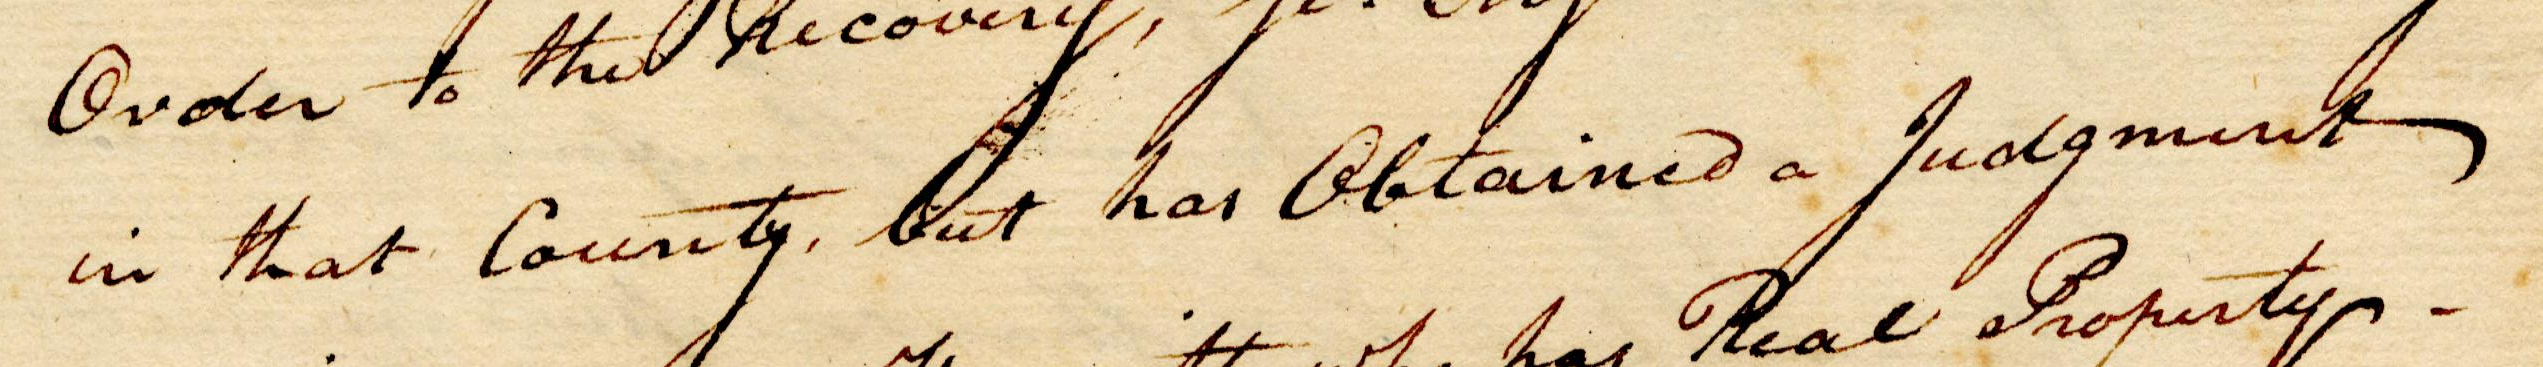in that County, but has Obtained a Judgment
